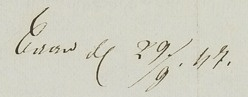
Baar den 29./9.47.
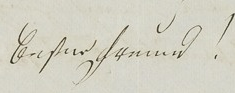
Bester Freund!
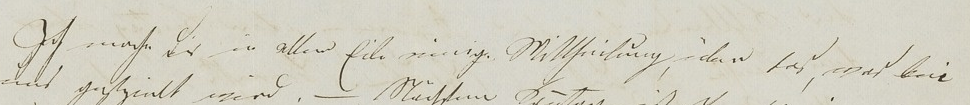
Ich mache Dir in aller Eile einige Mittheilung, über das, was bei
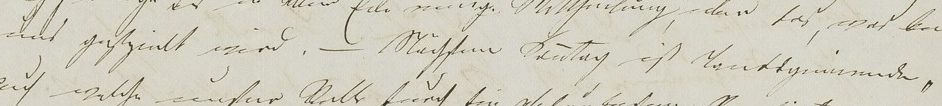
uns gespielt wird. – Nächsten Sonntag ist Landsgemeinde,
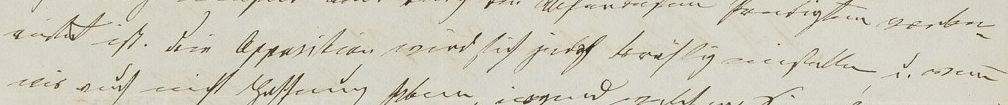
reitet ist. Die Opposition wird sich jedoch kräftig einstellen, u. wenn
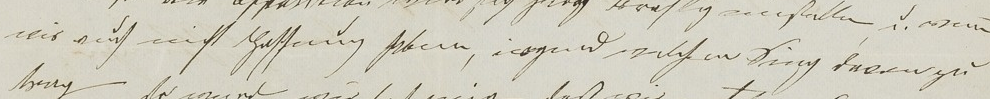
wir auch nicht Hoffnung haben, irgendwelchen Sieg davon zu
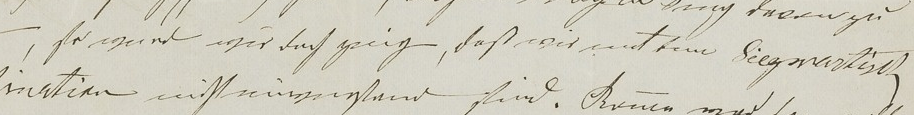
so werden wir doch zeigen, dass wir mit den Siegwartischen
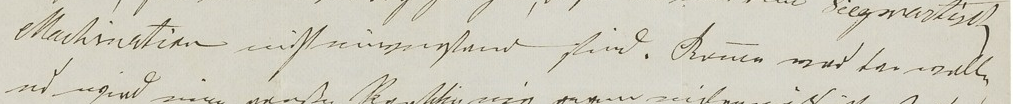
Machinationen nicht einverstanden sind. Komme was da wolle,
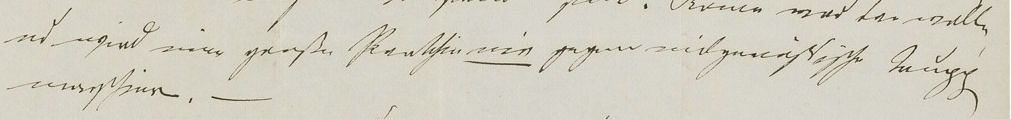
es wird eine große Parthei nie gegen eidgenössische Truppen
